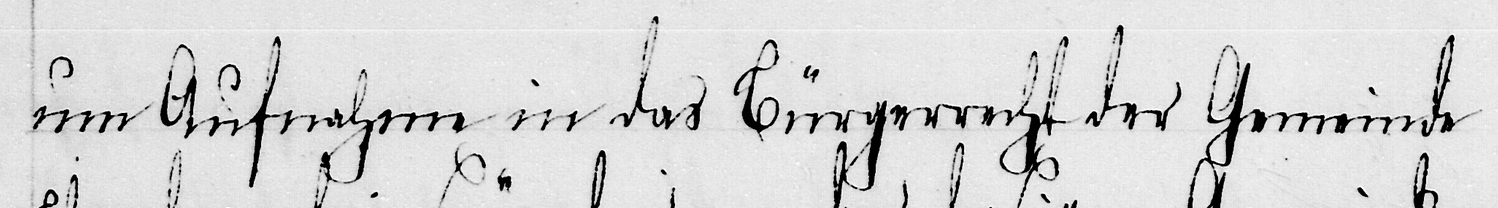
um Aufnahme in das Bürgerrecht der Gemeinde
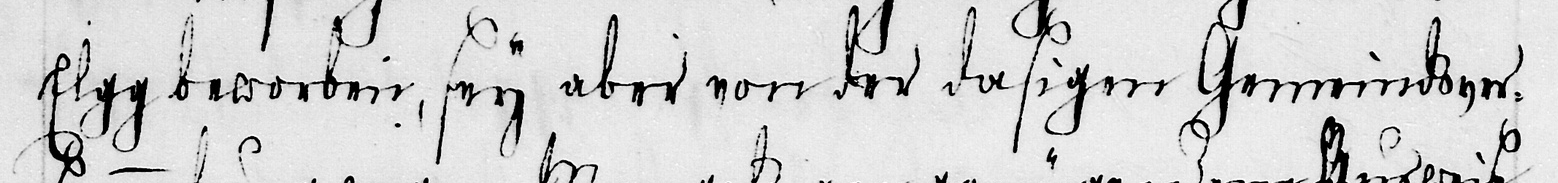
Elgg beworben, sey aber von der dasigen Gemeindsver¬
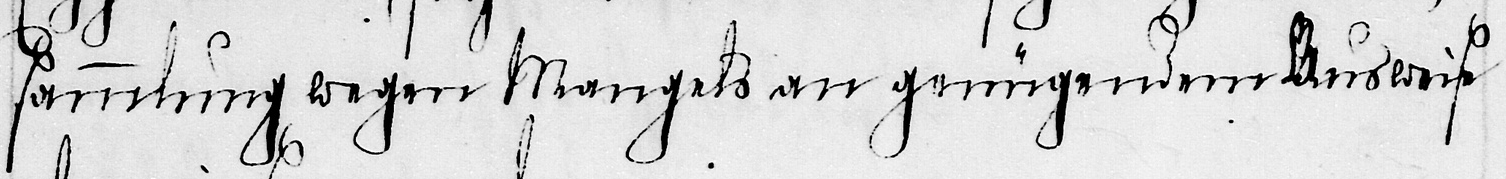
sammlung wegen Mangels an genügendem Ausweise
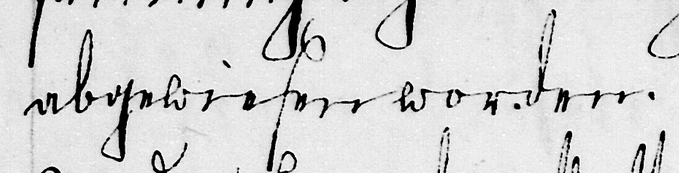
abgewiesen worden.
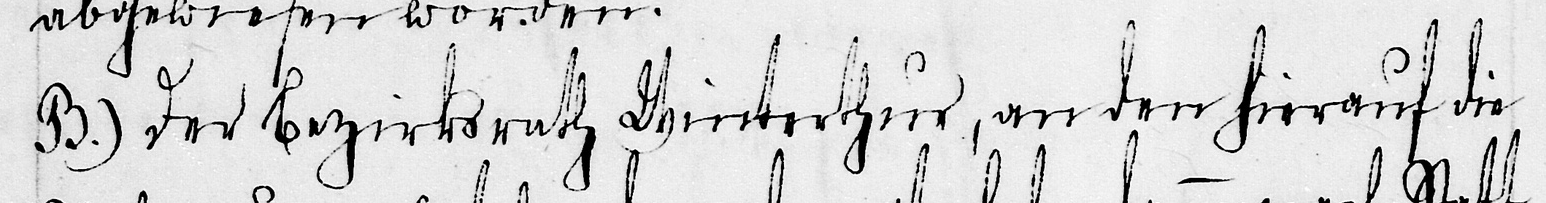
B.) Der Bezirksrath Winterthur, an den hierauf die
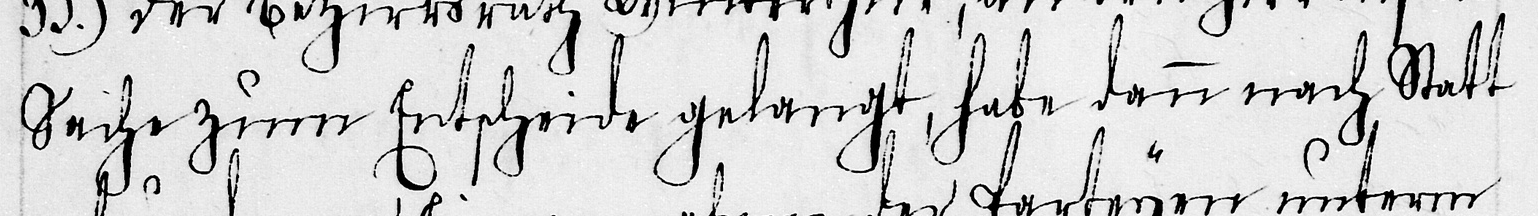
Sache zum Entscheide gelangt, habe dann nach Statt
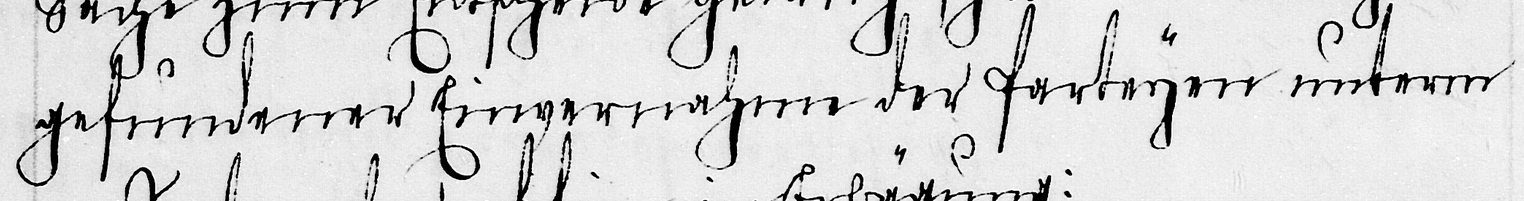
gefundener Einvernahme der Parteyen unterm
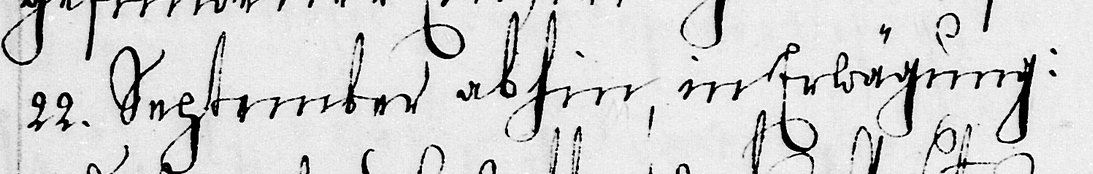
22. September abhin, in Erwägung:
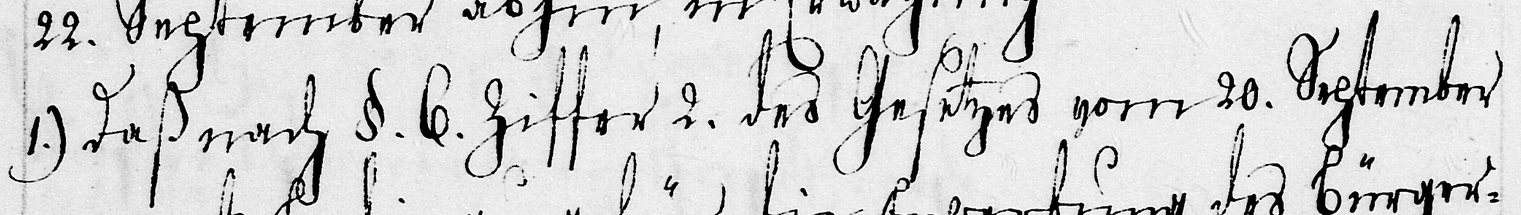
1.) Daß nach §. 6. Ziffer 2. des Gesetzes vom 20. September
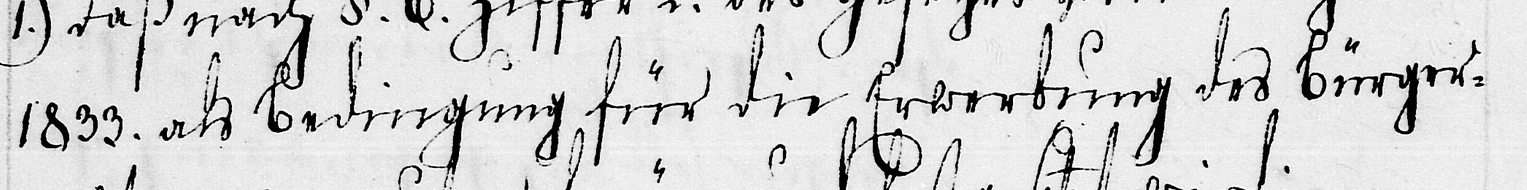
1833. als Bedingung für die Erwerbung des Bürger¬
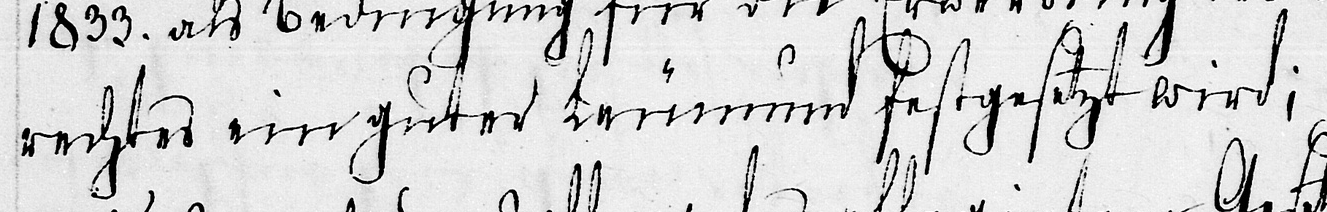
rechtes ein guter Leumund festgesetzt wird;
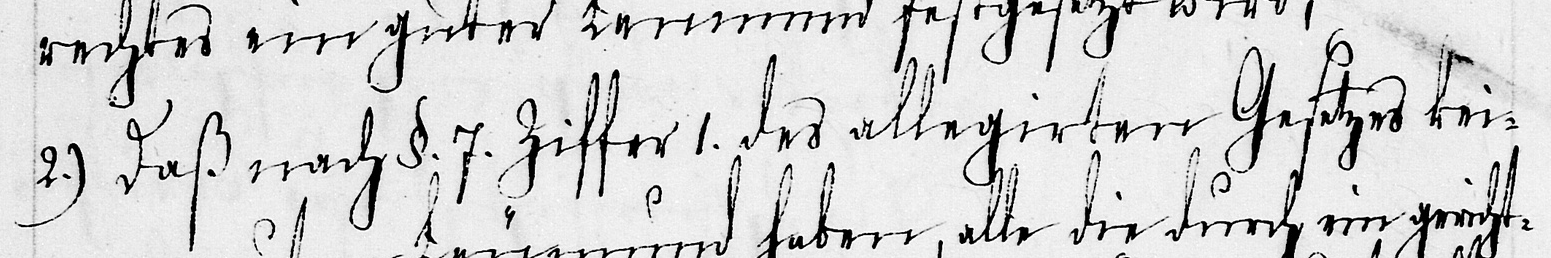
2.) Daß nach §. 7. Ziffer 1. des allegirten Gesetzes kei¬
